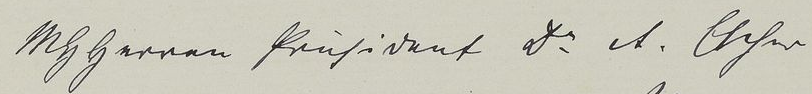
MH Herren Präsident Dr A. Escher
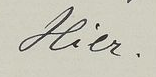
Hier.
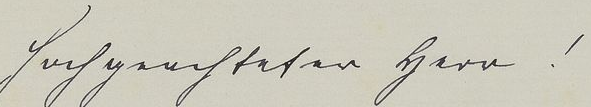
Hochgeachteter Herr!
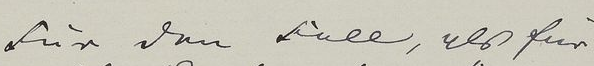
Für den Fall, als für
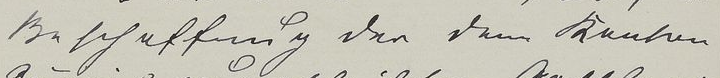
Beschaffung der dem Kanton
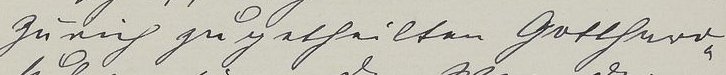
Zürich zugetheilten Gotthard-
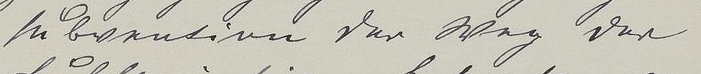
subvention der Weg der
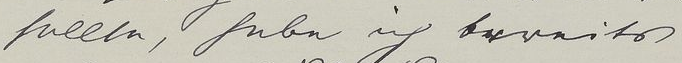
sollte, habe ich bereits
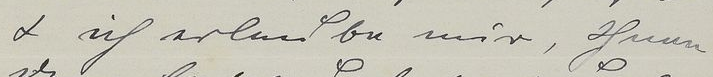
& ich erlaube mir, Ihnen
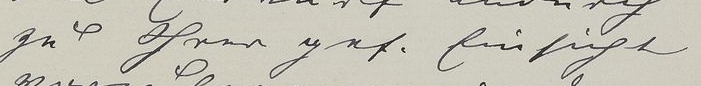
zu Ihrer gef. Einsicht
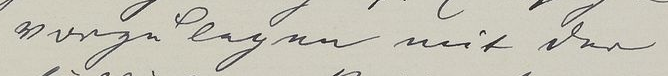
vorzulegen mit der
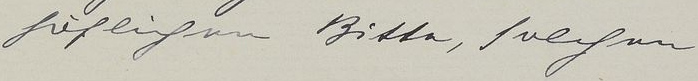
höflichen Bitte, solchen
